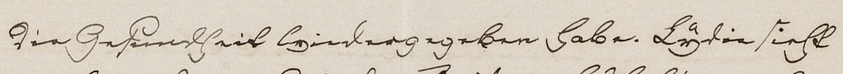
die Gesundheit wiedergegeben habe. Lydie sieht
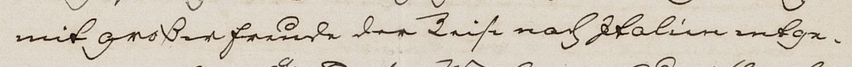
mit großer Freude der Reise nach Italien entge-
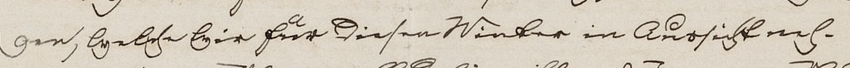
gen, welche wir für diesen Winter in Aussicht neh-
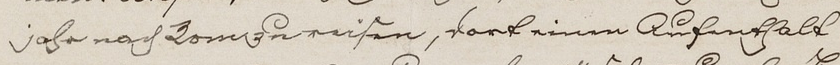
jahr nach Rom zu reisen, dort einen Aufenthalt
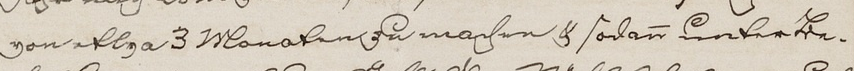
von etwa 3 Monaten zu machen & sodann unter Be-
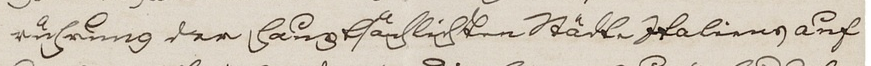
rührung der hauptsächlichsten Städte Italiens auf
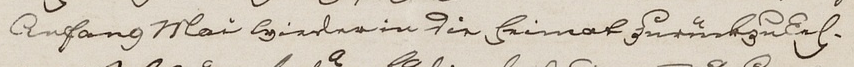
Anfang Mai wieder in die Heimat zurückzukeh-
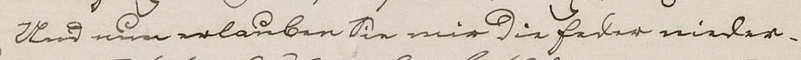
Und nun erlauben Sie mir die Feder nieder-
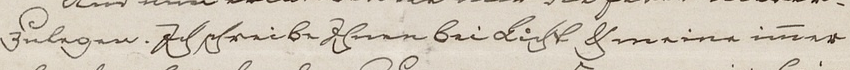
zulegen. Ich schreibe Ihnen bei Licht & meine immer
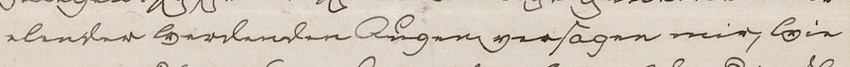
elender werdenden Augen versagen mir, wie
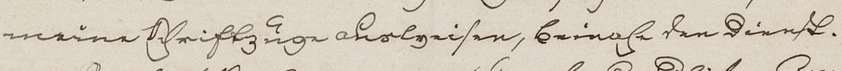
meine Schriftzüge ausweisen, beinahe den Dienst.
